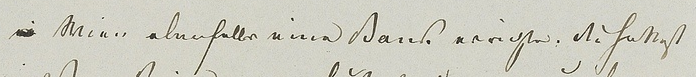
Wien ebenfalls eine Bank errichte. Du hattest
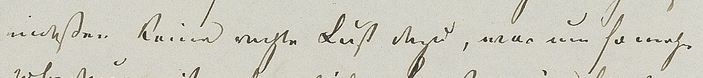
indeßen keine rechte Lust dazu, was um so mehr
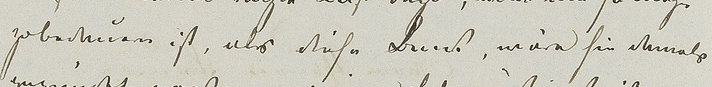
zu bedauern ist, als diese Bank, wäre sie damals
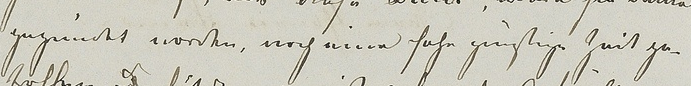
gegründet worden, noch eine sehr günstige Zeit ge-
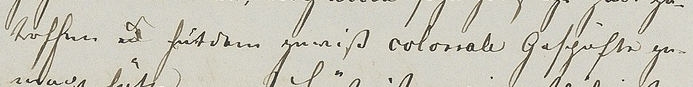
troffen und seitdem gewiß colossale Geschäfte ge-
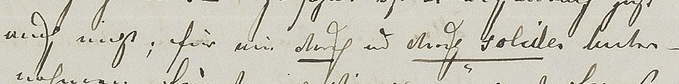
noch nicht; für ein durch und durch solides Unter-
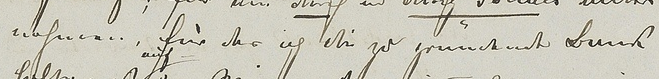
nehmen, für das ich die zu gründende Bank
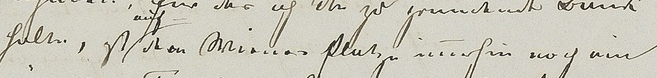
halte, ist auf dem Wiener Platze immerhin noch ein
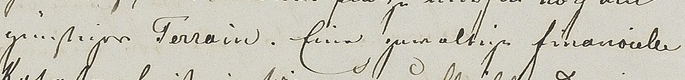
günstiges Terrain. Eine gewaltige financielle
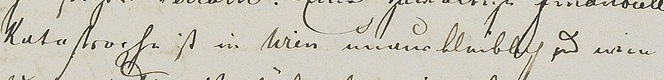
Katastrophe ist in Wien unausbleiblich und wie
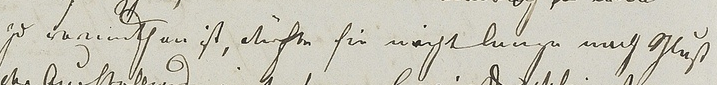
zu vermuthen ist, dürfte sie nicht lange nach Schluß
